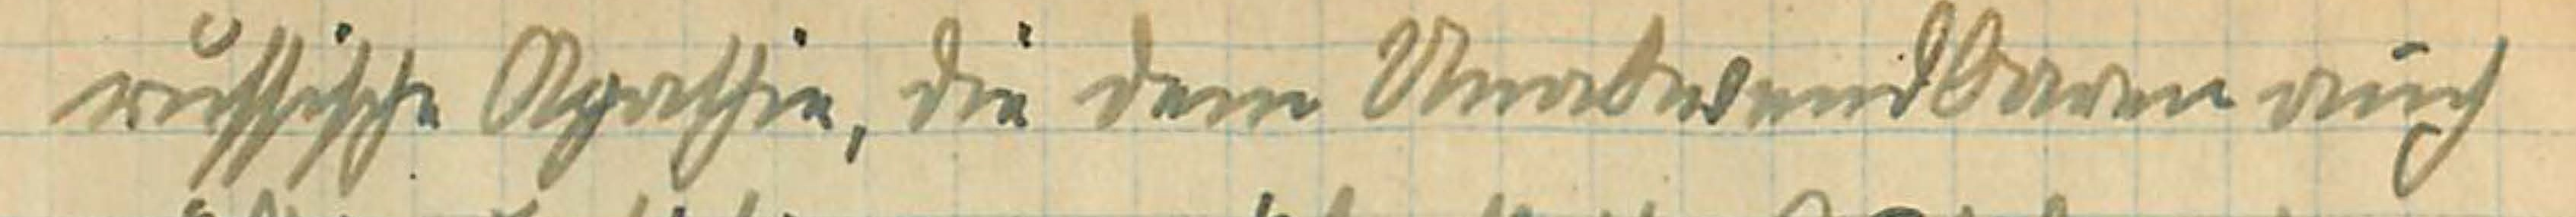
russische Apathie, die dem Unabwendbaren auch
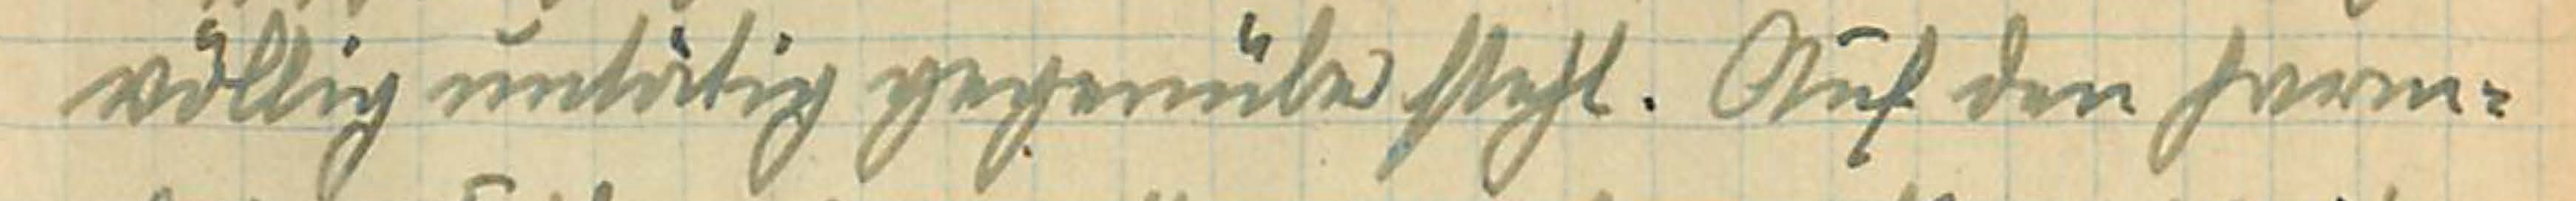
völlig untätig gegenüber steht. Auf den harm-
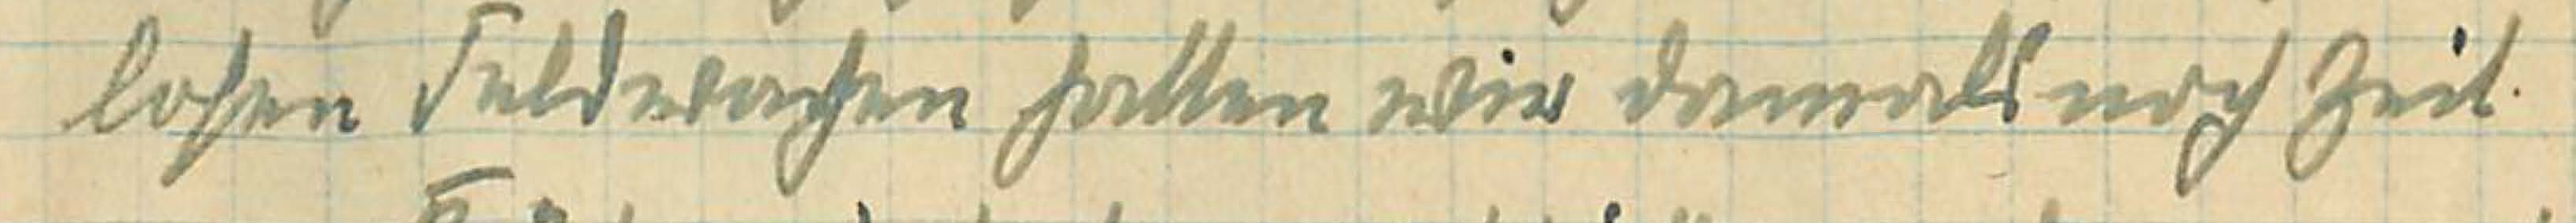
losen Feldwachen hatten wir damals noch Zeit
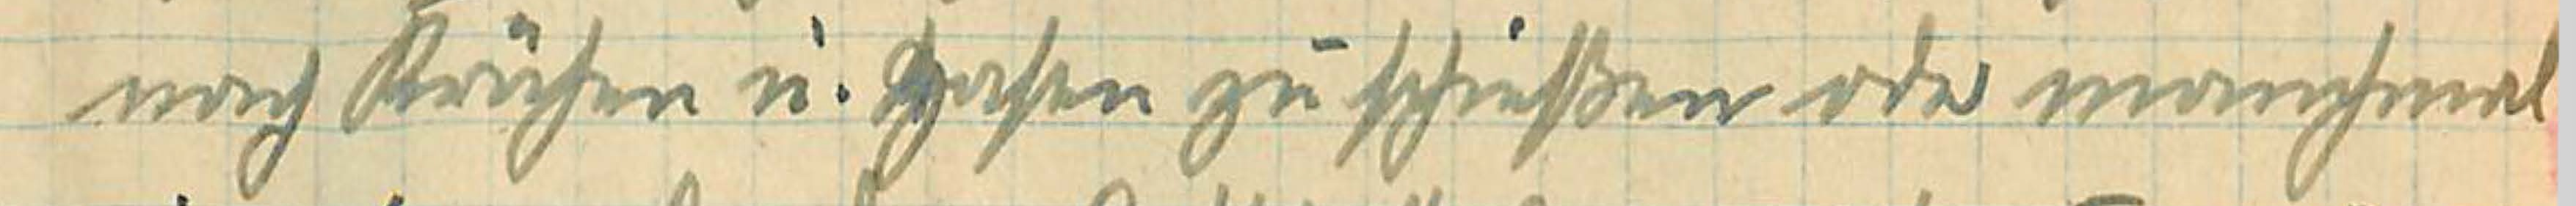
nach Krähen u. Hasen zu schießen oder manchmal
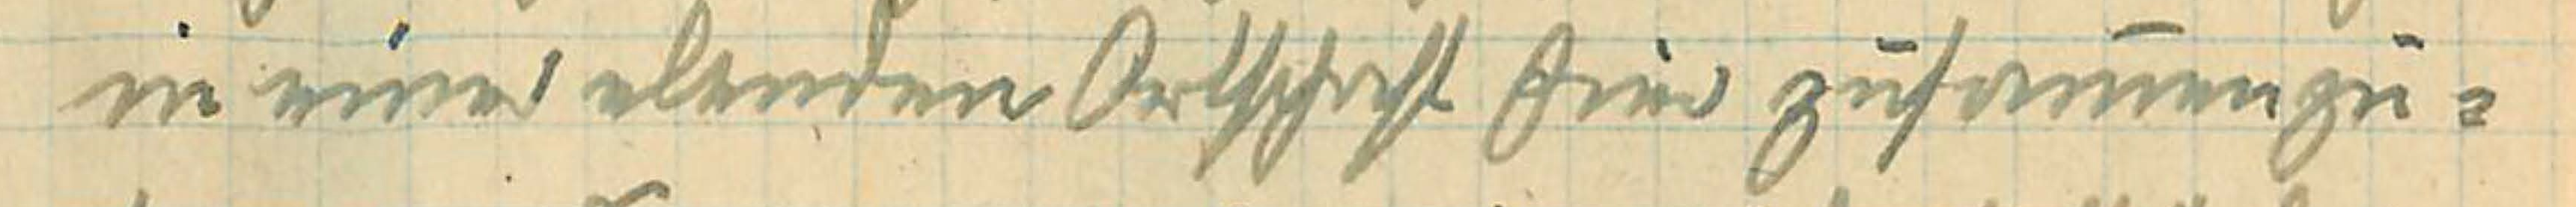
in einer elenden Ortschaft Eier zusammenzu-
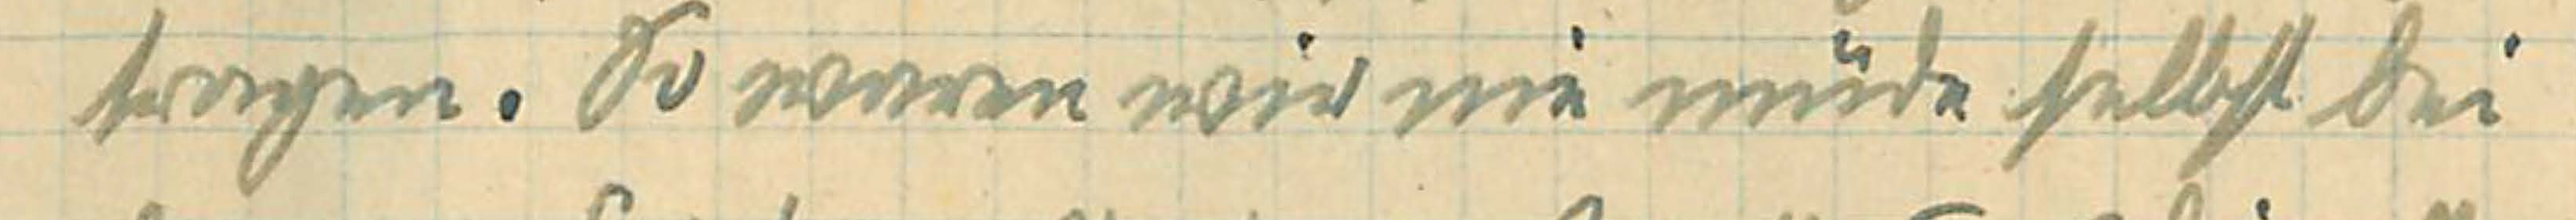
tragen. So waren wir nie müde selbst bei
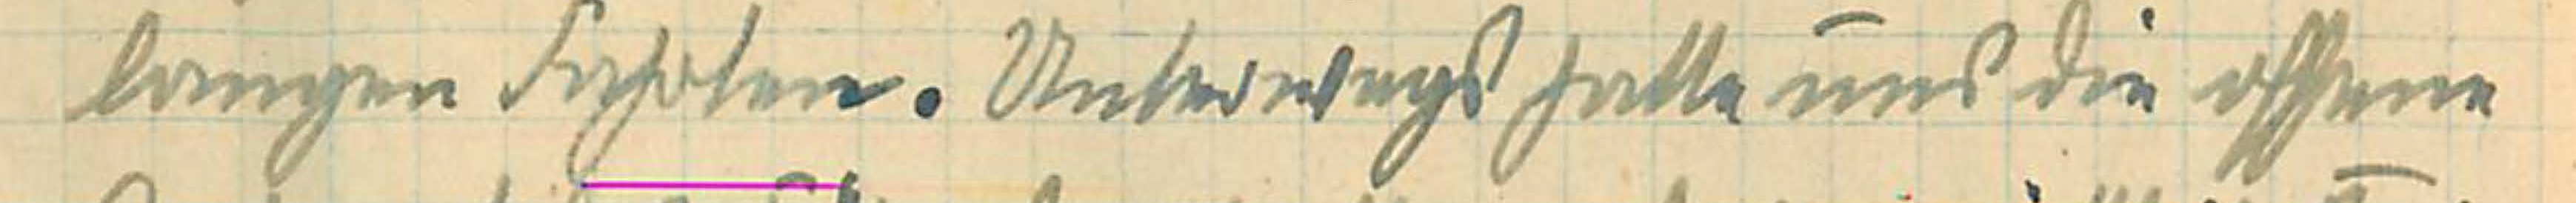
langen Fahrten. Unterwegs hatte uns die offene
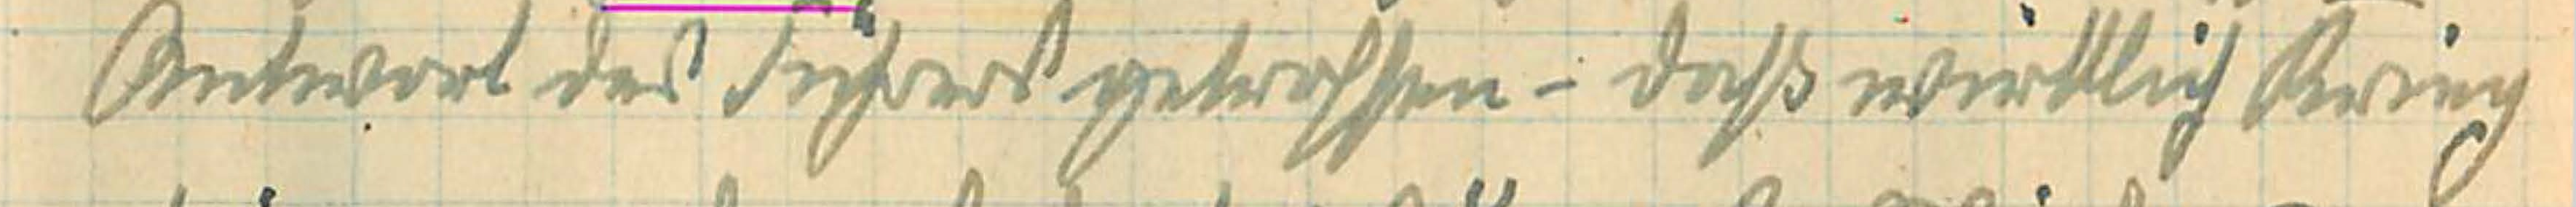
Antwort des Führers getroffen – daß wirklich Krieg
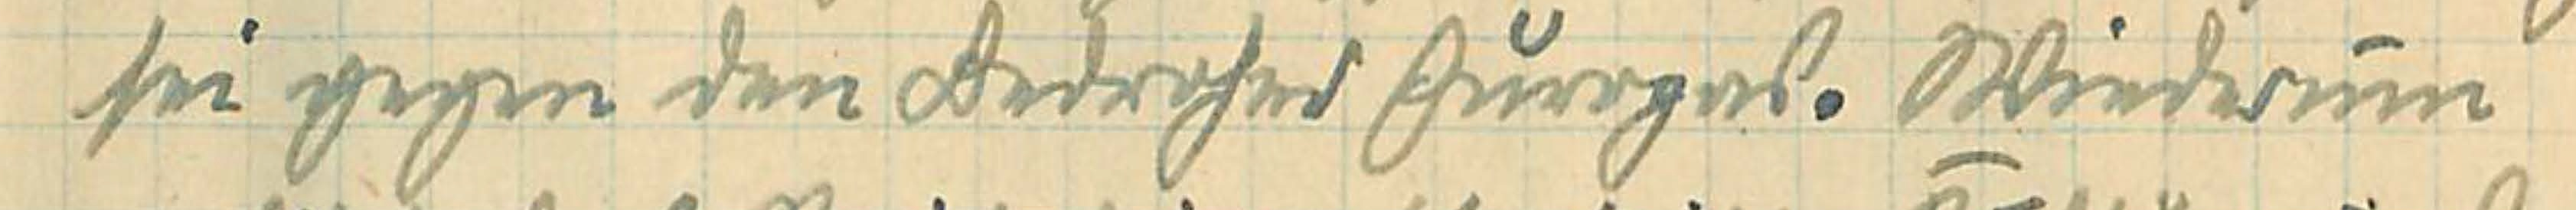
sei gegen den Bedroher Europas. Wiederum
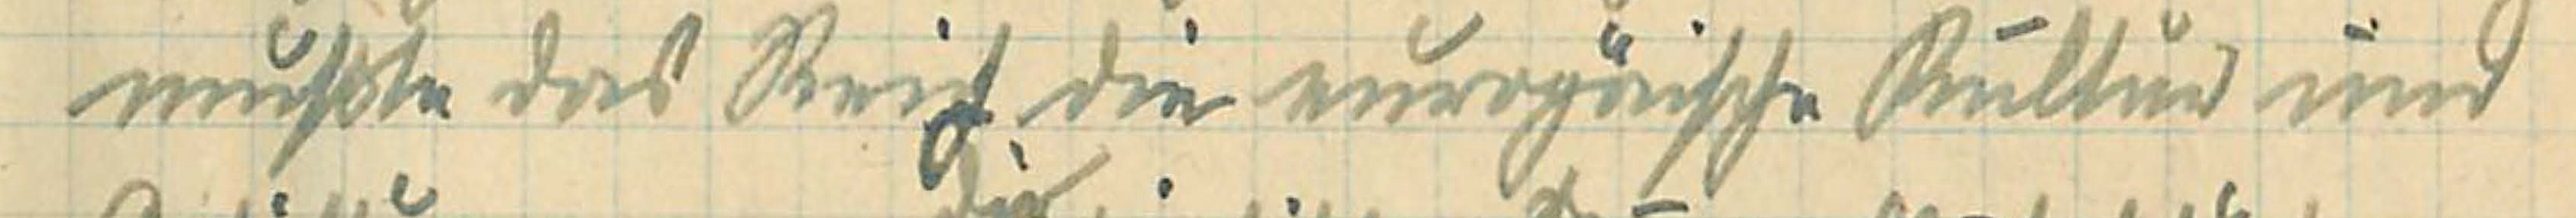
mußte das Reich die europäische Kultur und
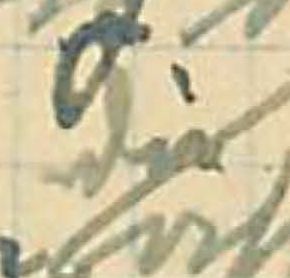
die
